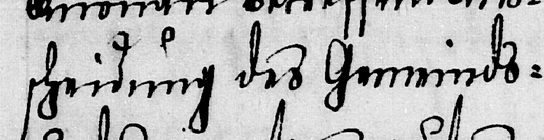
scheidung der Gemeinds-
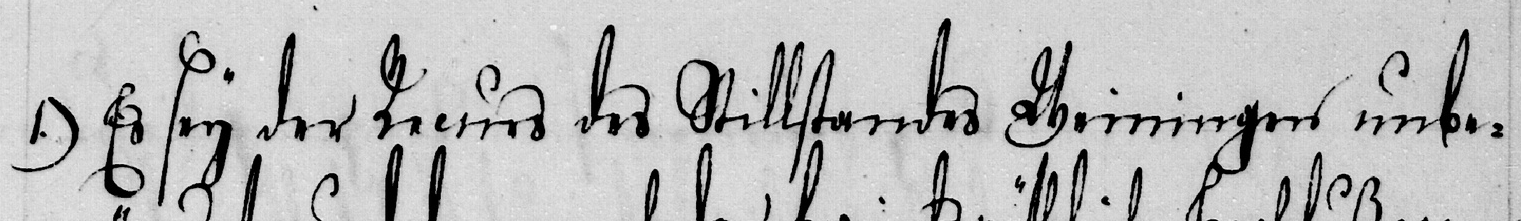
Es sey der Recurs des Stillstandes Weiningen unbe¬
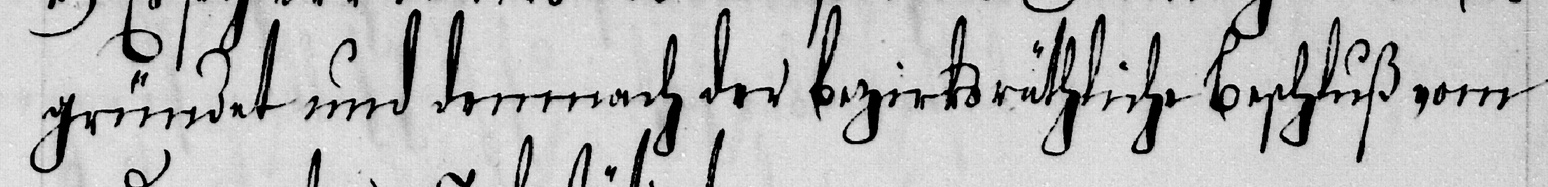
gründet und demnach der bezirksräthliche Beschluß vom
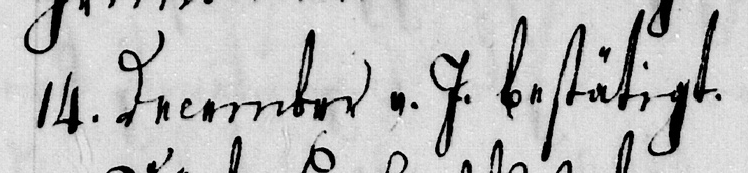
14. December v. J. bestätigt.
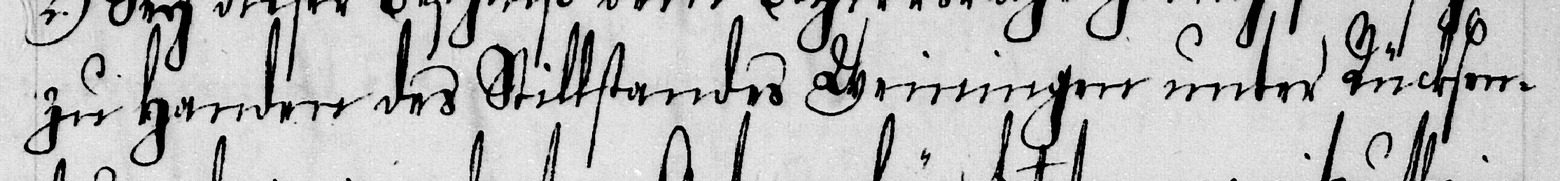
zu Handen des Stillstandes Weiningen unter Rücksen¬
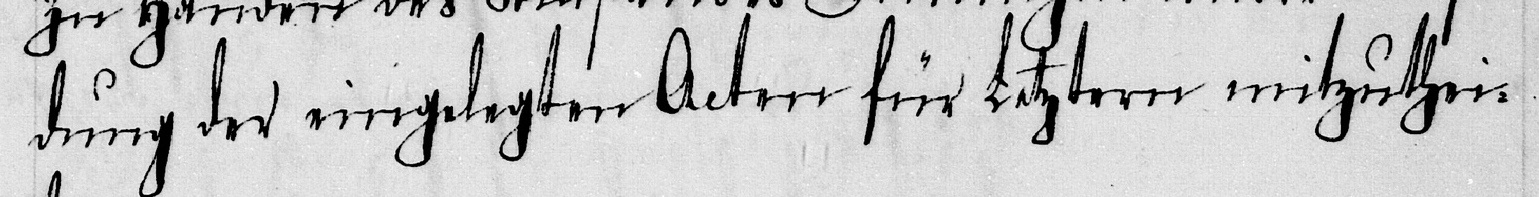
dung der eingelegten Acten für Letztern mitzuthei¬
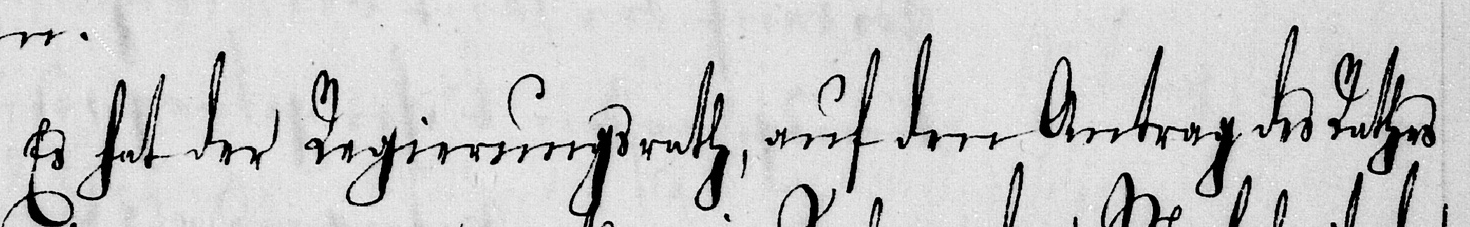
Es hat der Regierungsrath, auf den Antrag des Rath¬
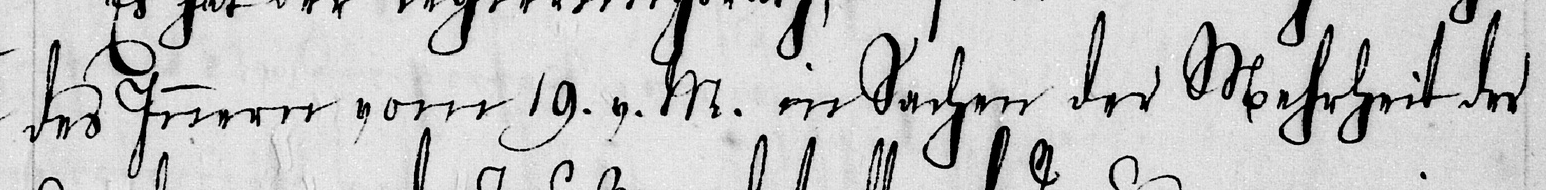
des Innern vom 19. v. M. in Sachen der Mehrheit der
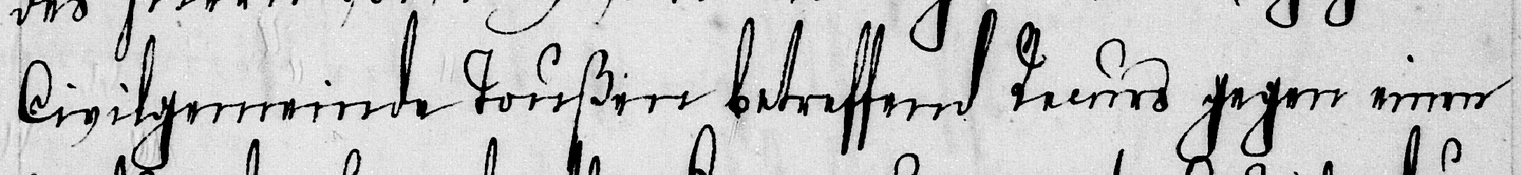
Civilgemeinde Toußen betreffend Recurs gegen einen
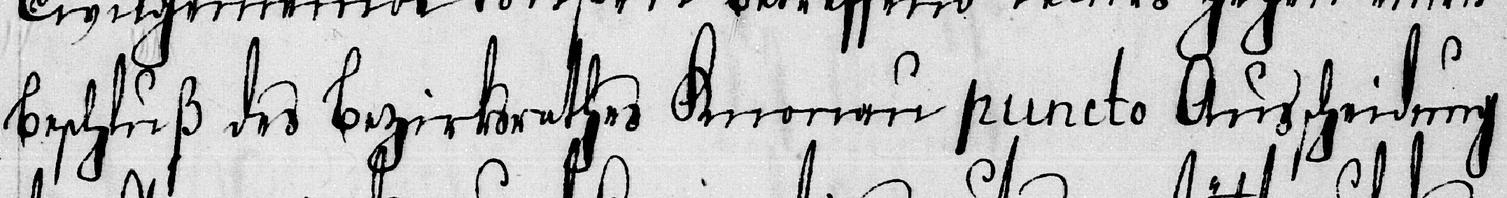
Beschluß des Bezirksrathes Knonau puncto Ausscheidung
